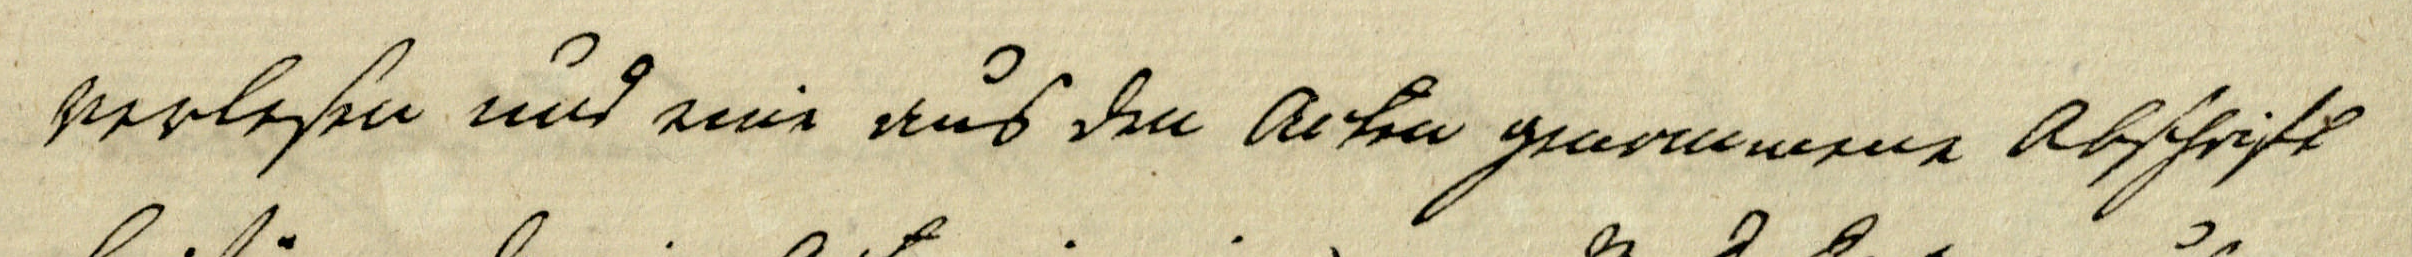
verlesen und eine aus den Acten genommene Abschrift
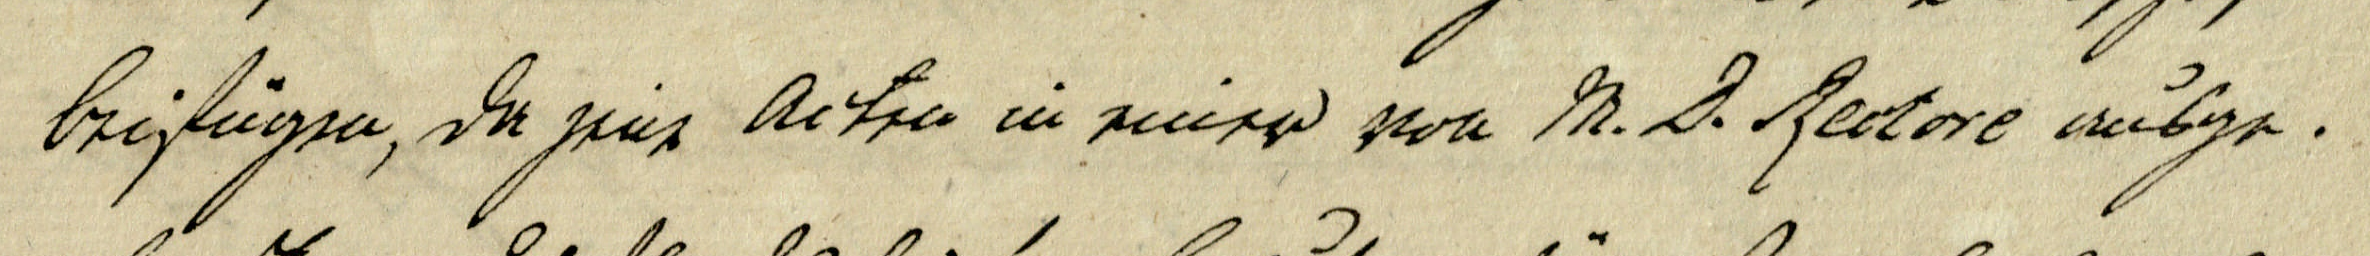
beifügen, da jene Acten in einer von M. D. Rectore ausge¬
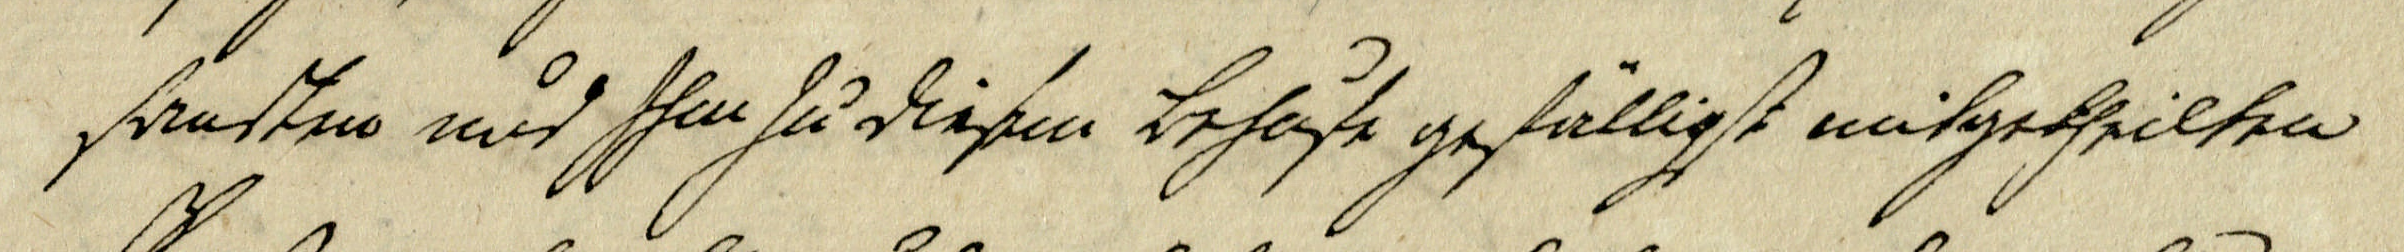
sandten und Ihm zu diesem Behufe gefälligst mitgetheilten
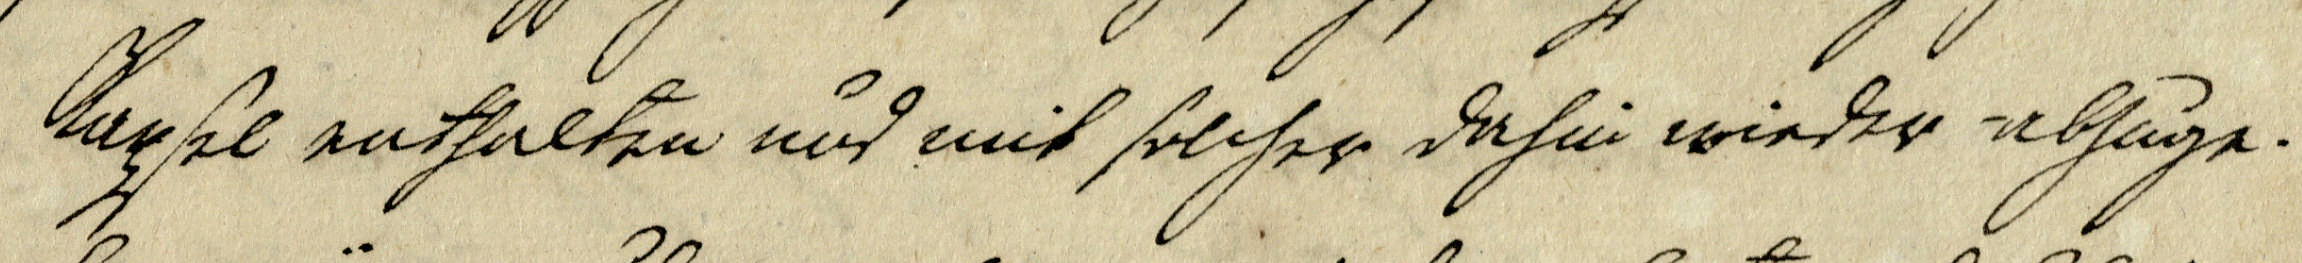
Kapsel enthalten und mit solcher dahin wieder abzuge¬
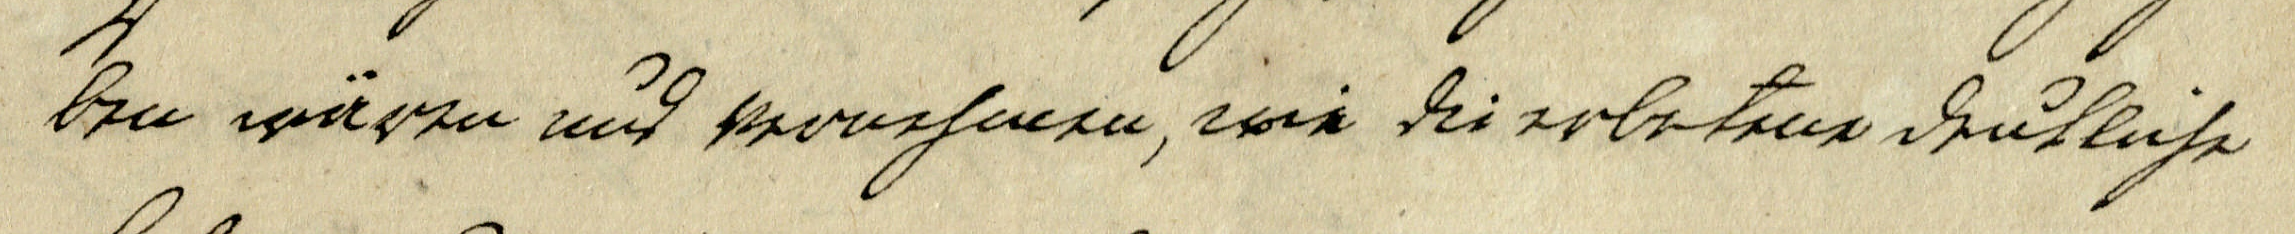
ben wären und vernehmen, wie die erbetene deutliche
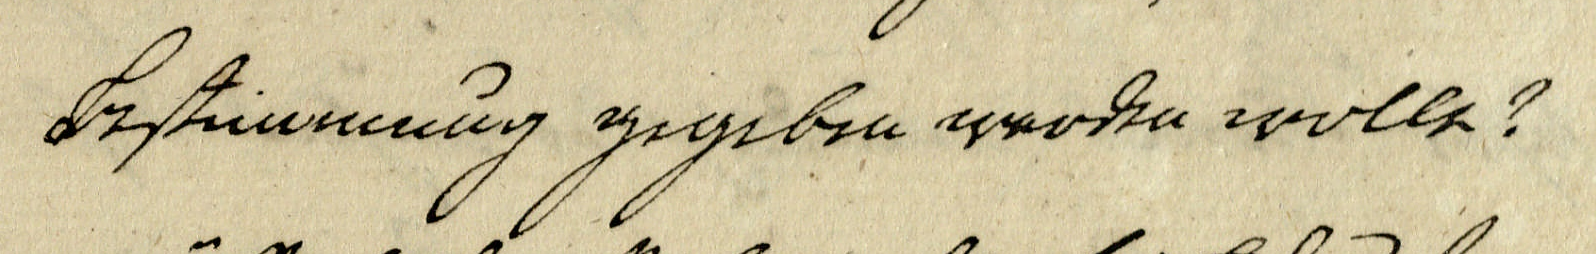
Bestimmung gegeben werden wolle?
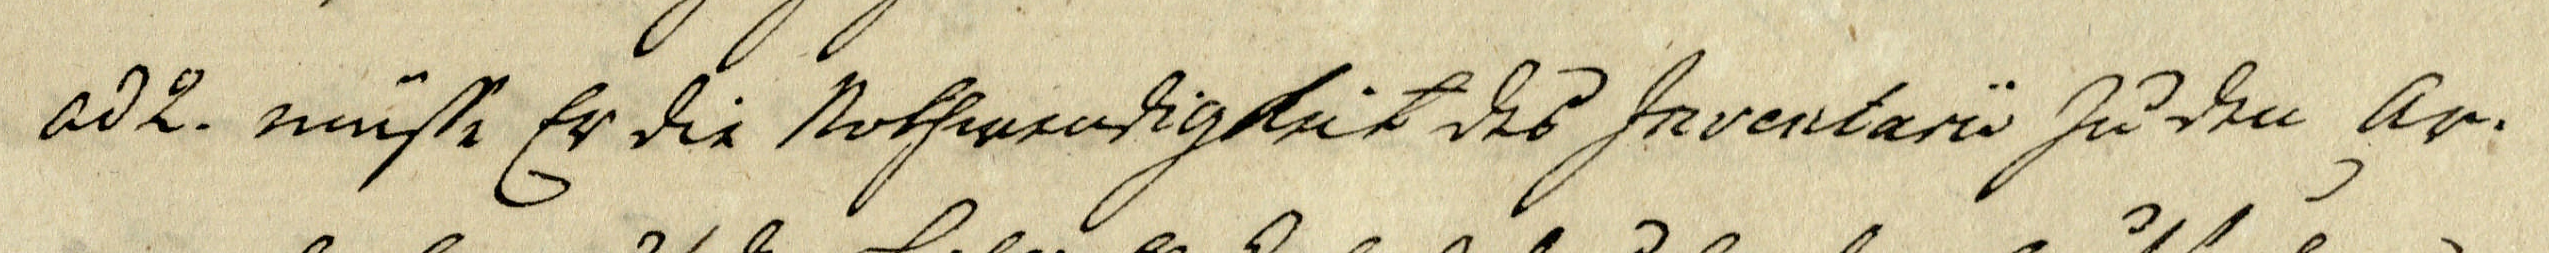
ad 2. müsse Er die Nothwendigkeit des Inventario zu den Ar¬
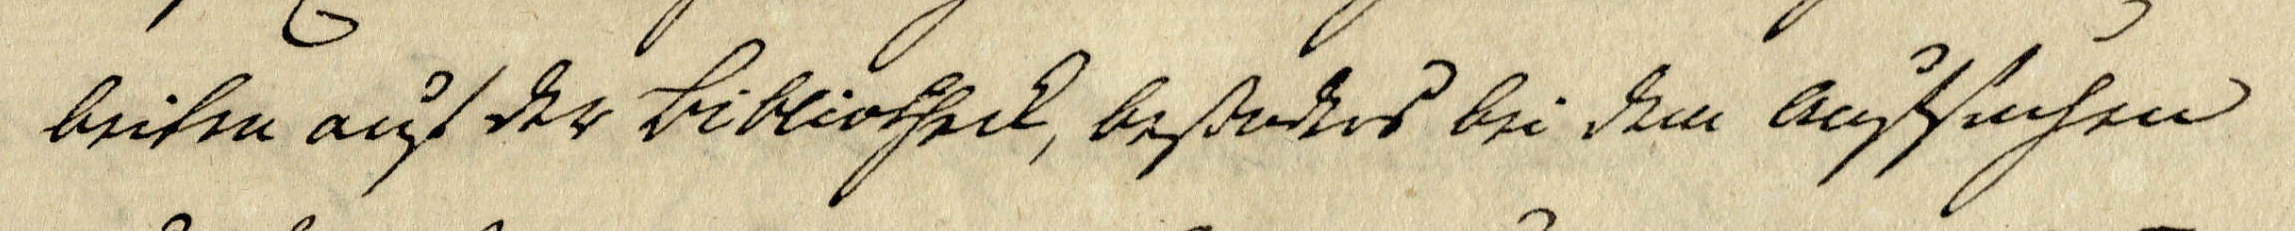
beiten auf der Bibliotheck, besonders bei dem Aufsuchen
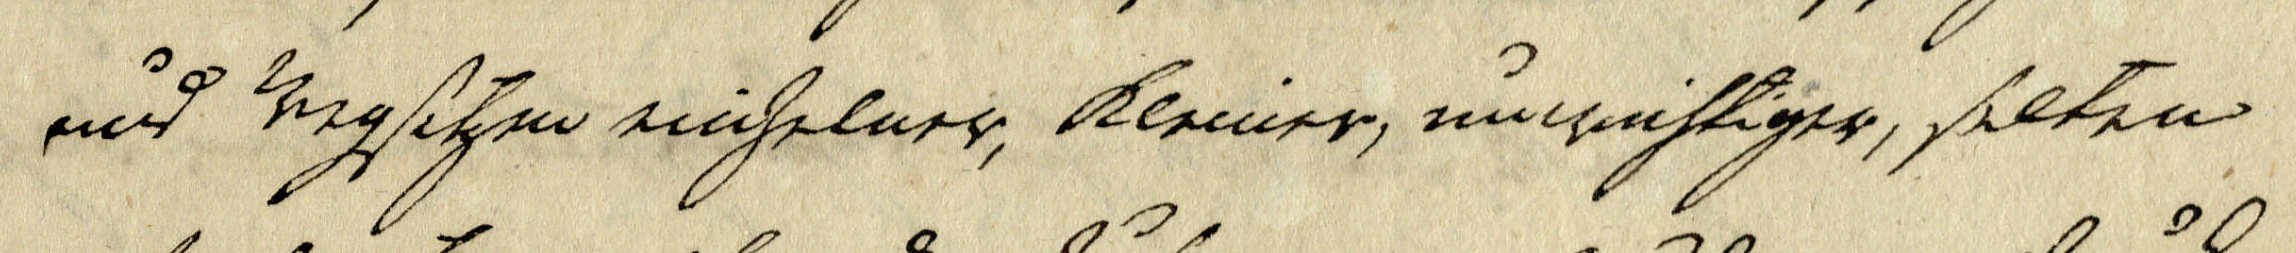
und Wegsetzen einzelner, kleiner, unwichtiger, selten
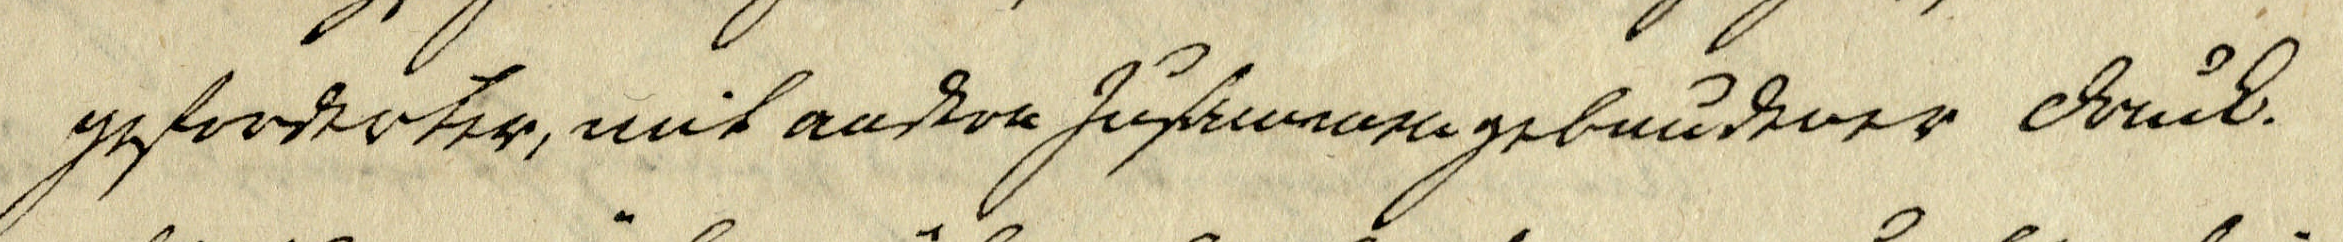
geforderter, mit andern zusamnengebundener Druck¬
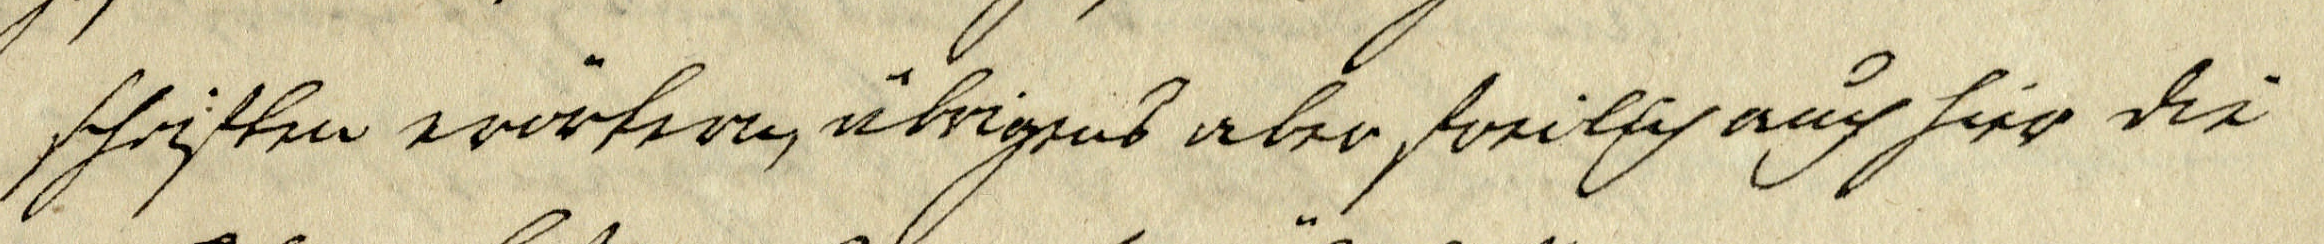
schriften erörtern, übrigens aber freilich auch hier die
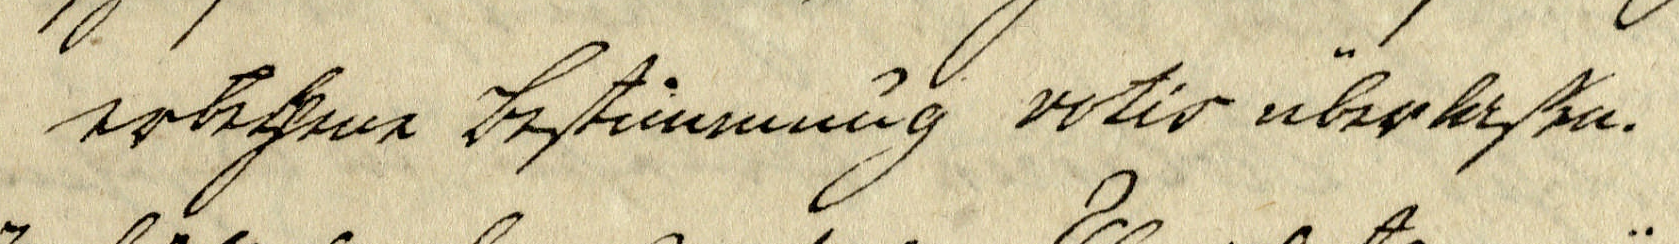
erbethene Bestimmung votis überlassen.
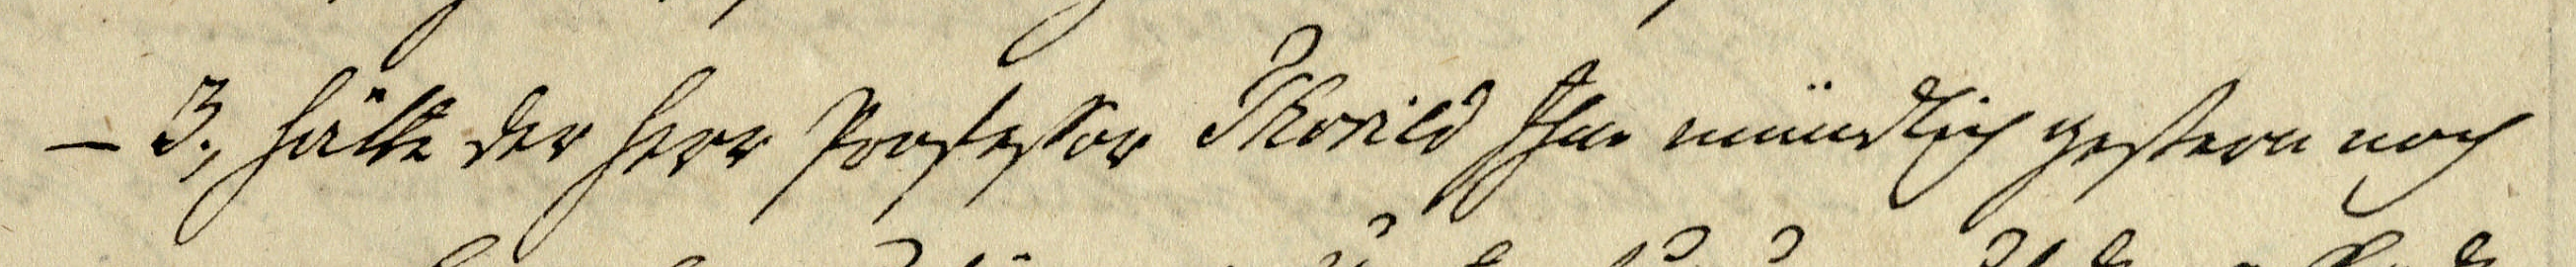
3., hätte der Herr Professor Thorild ihm mündlich gestern noch
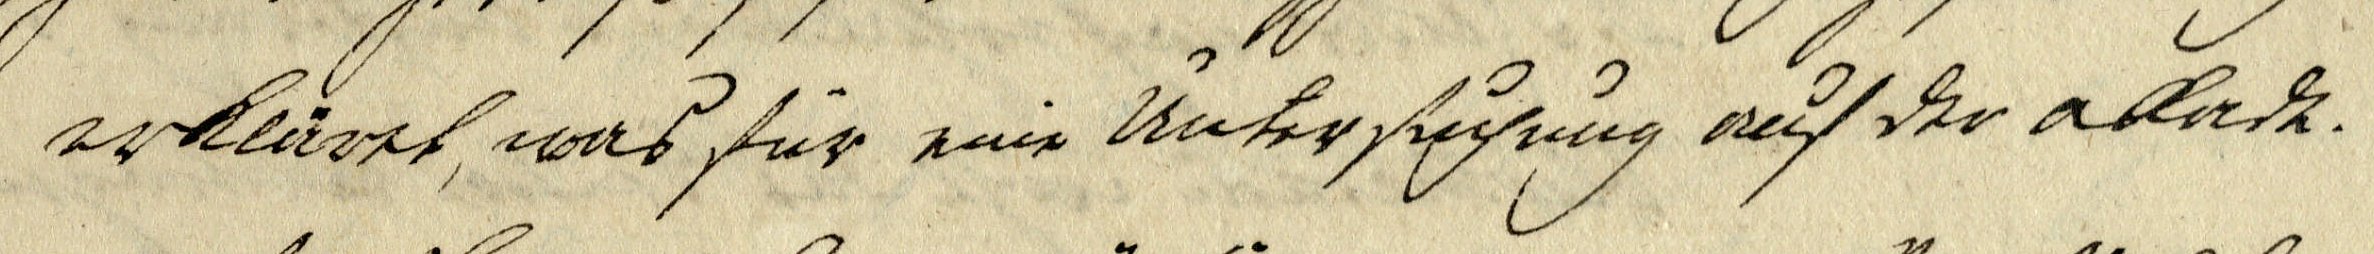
erkläret, was für eine Untersuchung auf der akade¬
